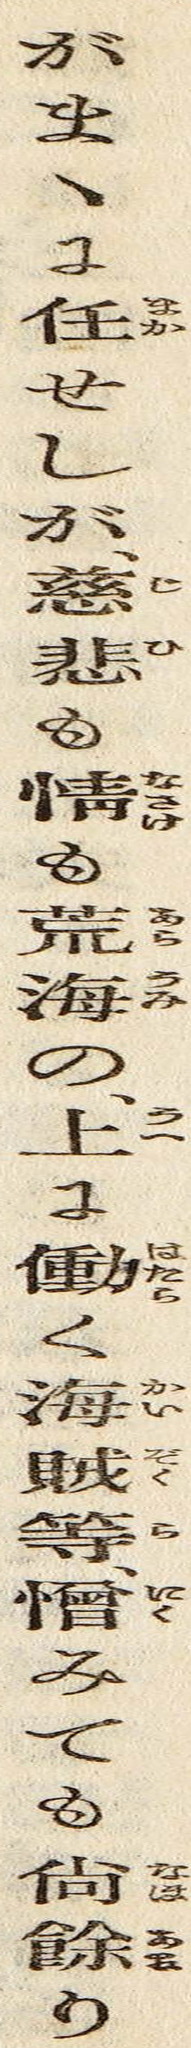がまゝに任せしが、慈悲も情も荒海の、上に働く海賊等、憎みても尚余り
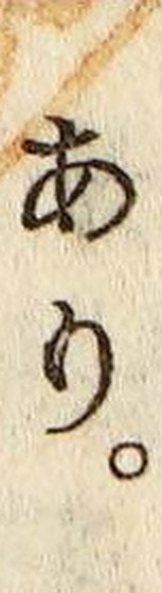あり。
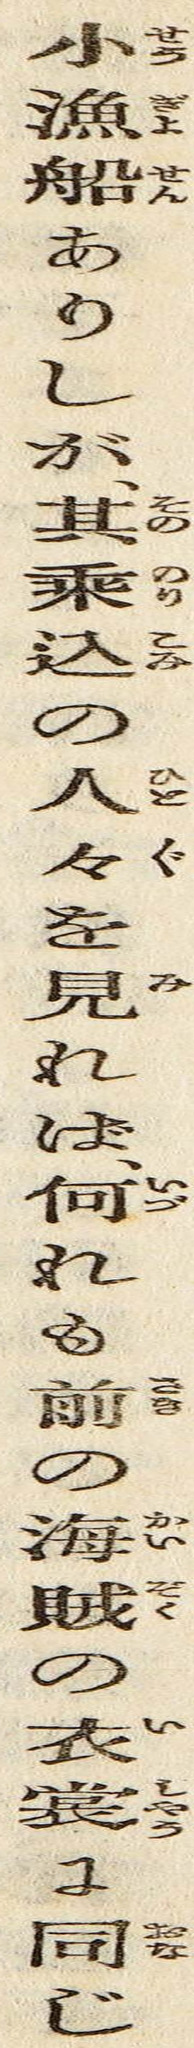小漁船ありしが、其乗込の人々を見れば、何れも前の海賊の衣装に同じ
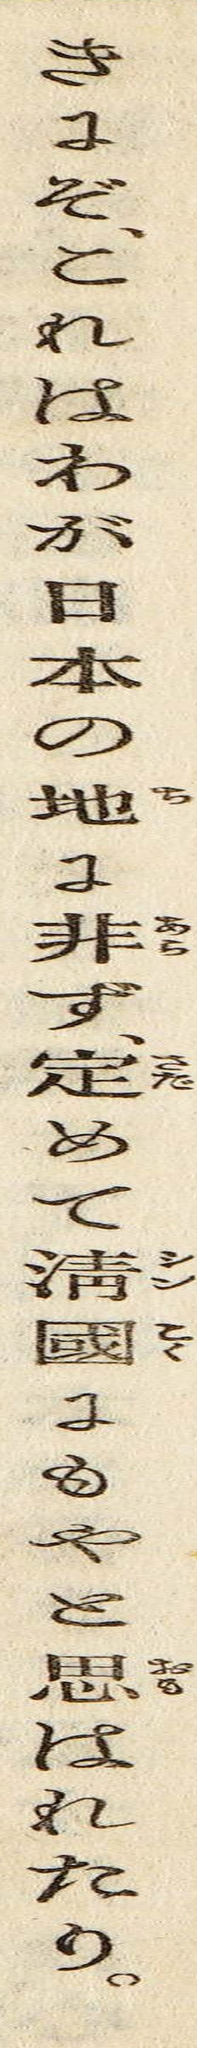きにぞ、これはわが日本の地に非ず、定めて清国にもやと思はれたり。
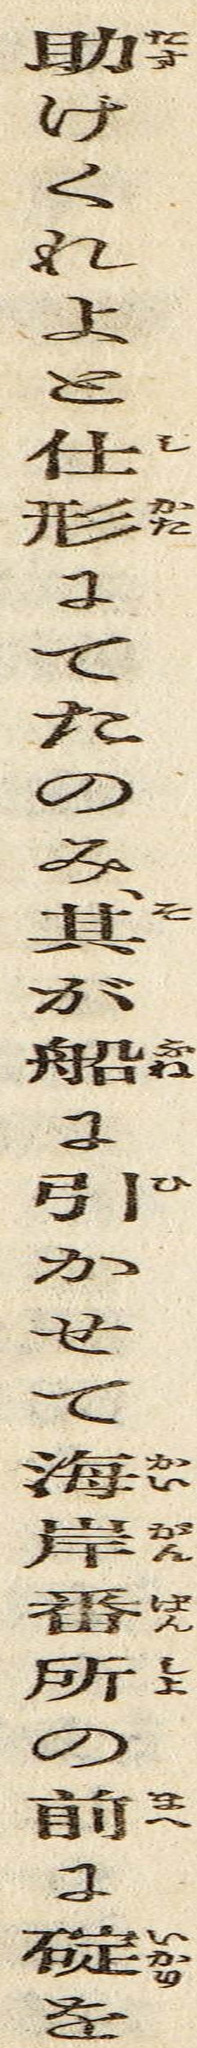助けくれよと仕形にてたのみ、其が船に引かせて海岸番所の前に碇をを

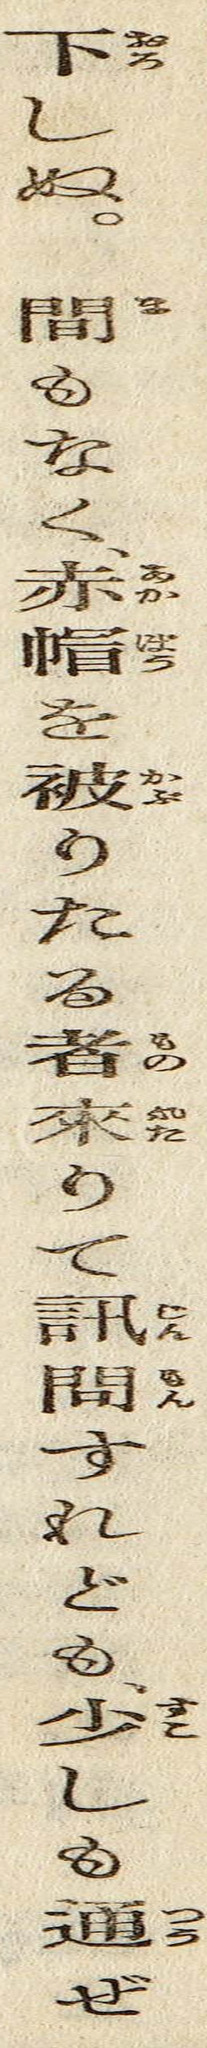下しぬ。間もなく、赤帽を被りたる者来りて訊問すれども、少しも通ぜ
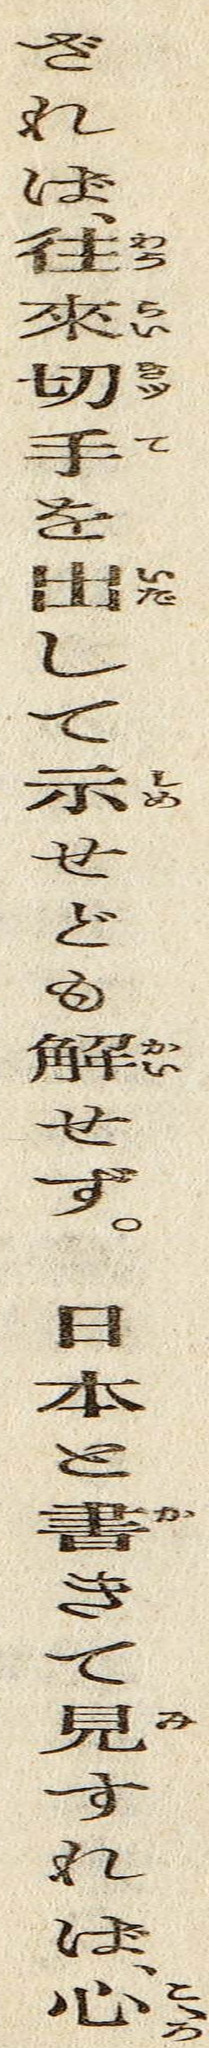ざれば、往来切手を出して示せども解せず。日本と書きて見すれば、心
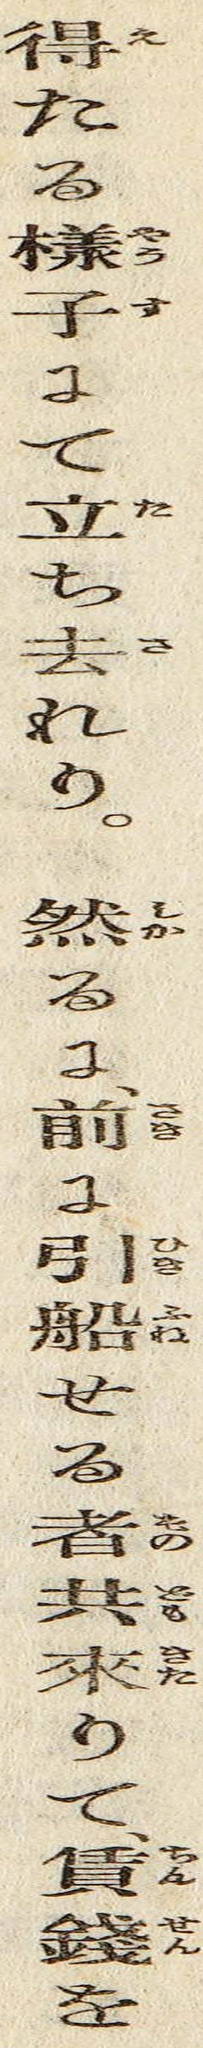得たる様子にて立ち去れり。然るに、前に引船せる者共来りて、賃銭を
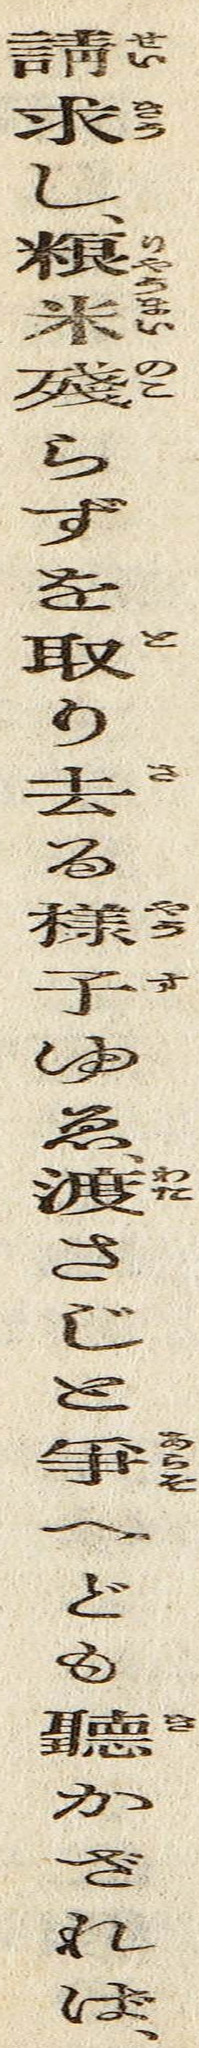請求し、糧米残らずを取り去る様子ゆえ渡さじと争えへども聴かざれば、
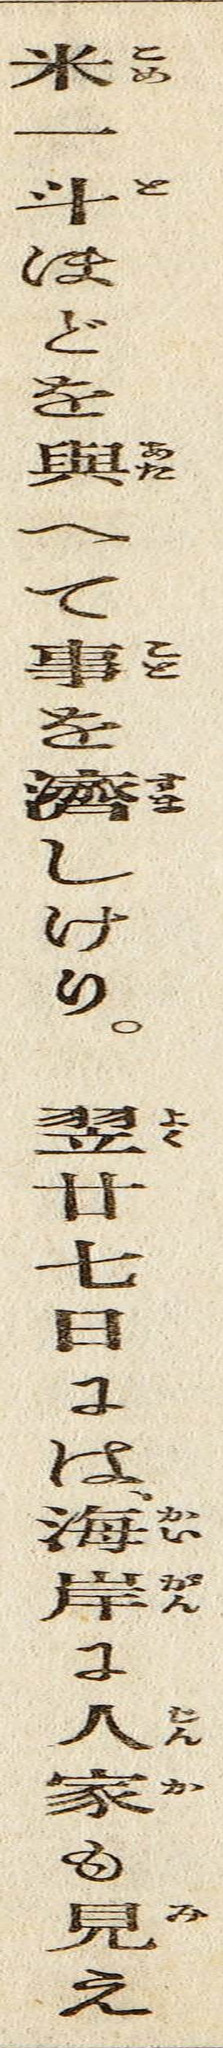米一斗ほどを与へて事を済しけり。翌廿七日には、海岸に人家も見え
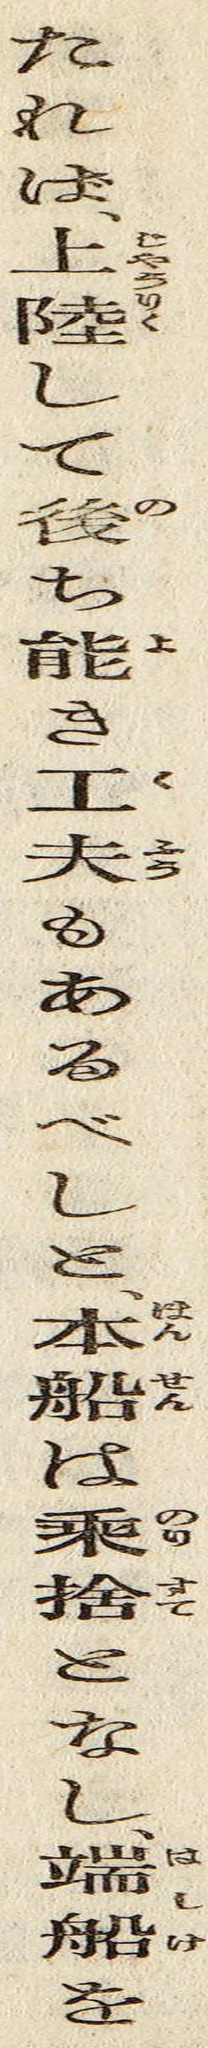たれば、上陸して後ち能き工夫もあるべしと、本船は乗捨となし、端船を
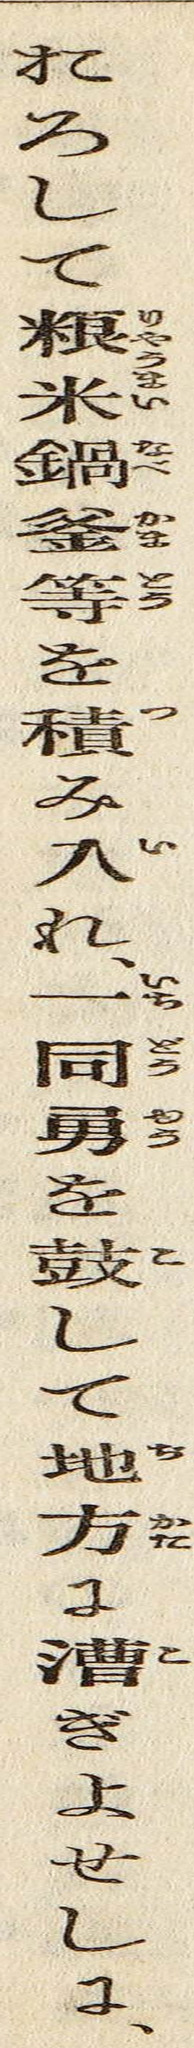おろして糧米鍋釜等を積み入れ、一同勇を鼓して地方に漕ぎよせしに、
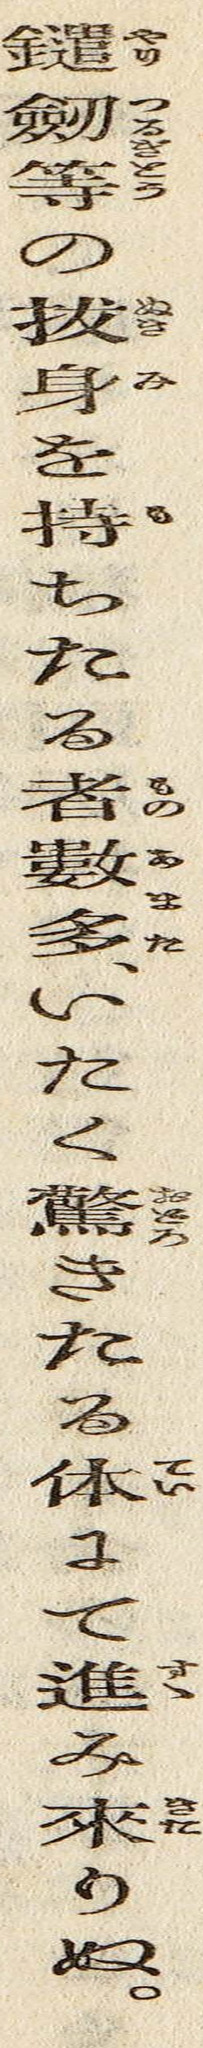鑓剣等の抜身を持ちたる者数多、いたく驚きたる体にて進み来たりぬ。
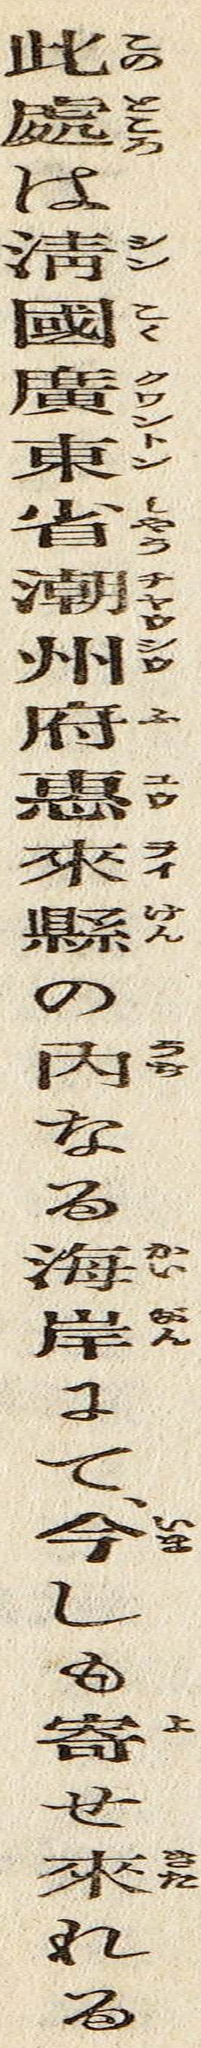此所は清国広東省潮州府恵来県の内なる海岸にて、今しも寄せ来れる
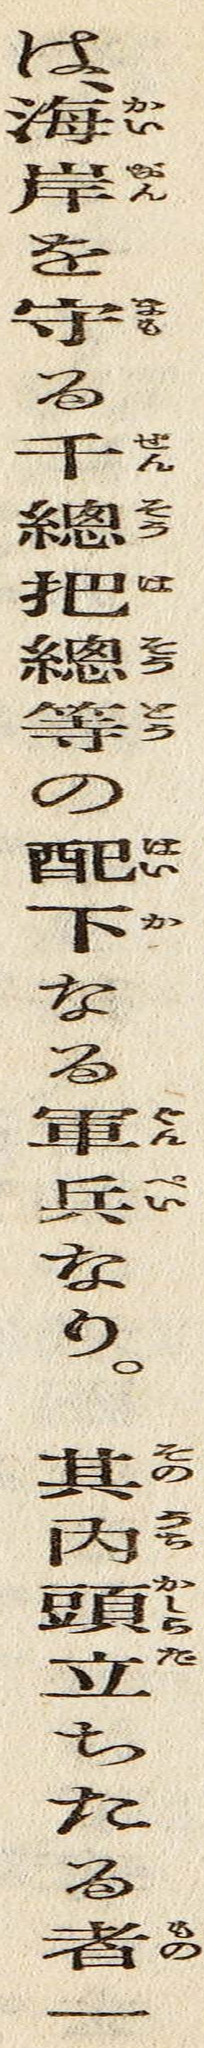は、海岸を守る千総把総等の配下なる軍兵なり。其内頭立ちたる者一
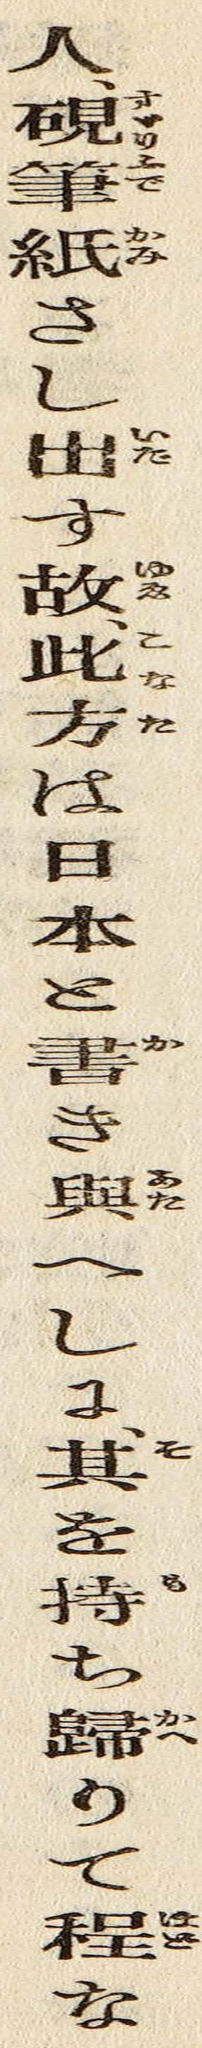人、硯筆紙さし出す故此方は日本と書き与へしに、其を持ち帰りて程な
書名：日本漂流譚
